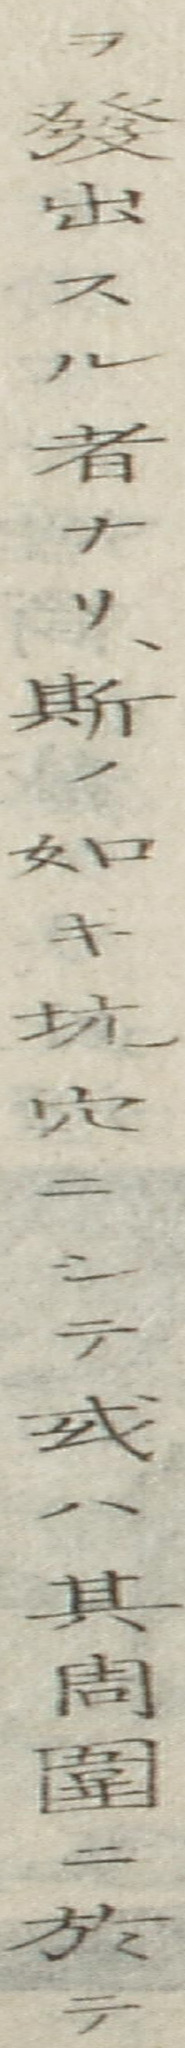ヲ発出スル者ナリ、斯ノ如キ坑穴ニシテ或ハ其周囲ニ於テ
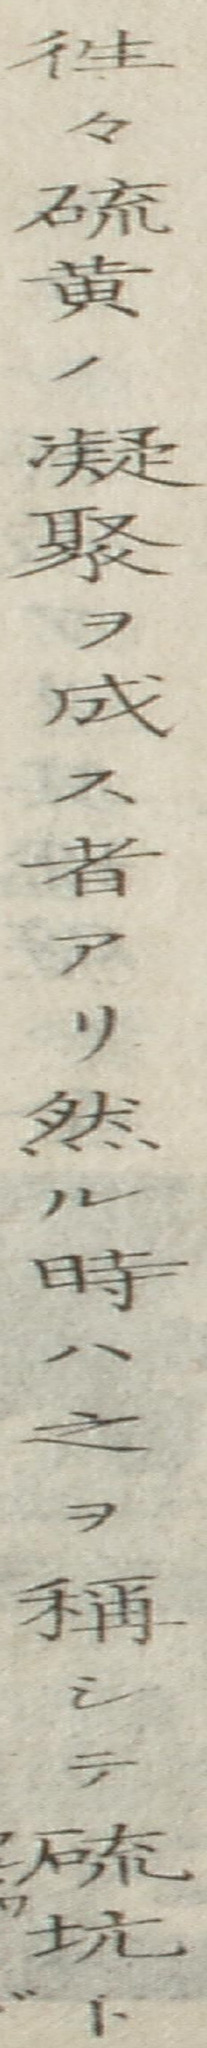往々硫黄ノ凝聚ヲ成ス者アリ然ル時ハ之ヲ稱シテ硫坑ト
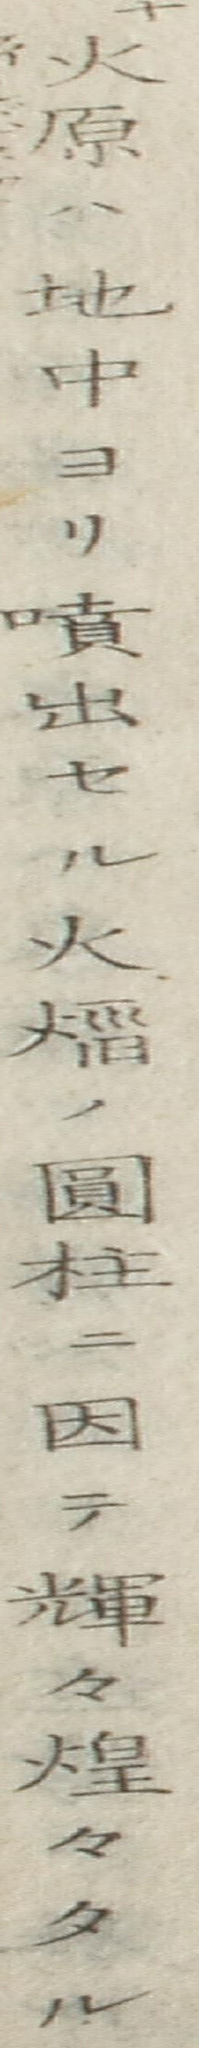四十火原ハ地中ヨリ噴出セル火焔ノ円柱ニ因テ輝々煌々タル
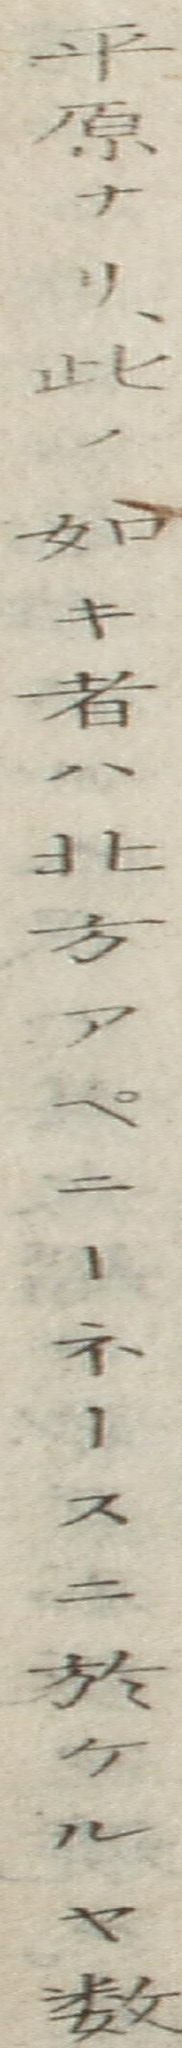平原ナリ、此如キ者ハ北方アペニーネースニ於ケルヤ数

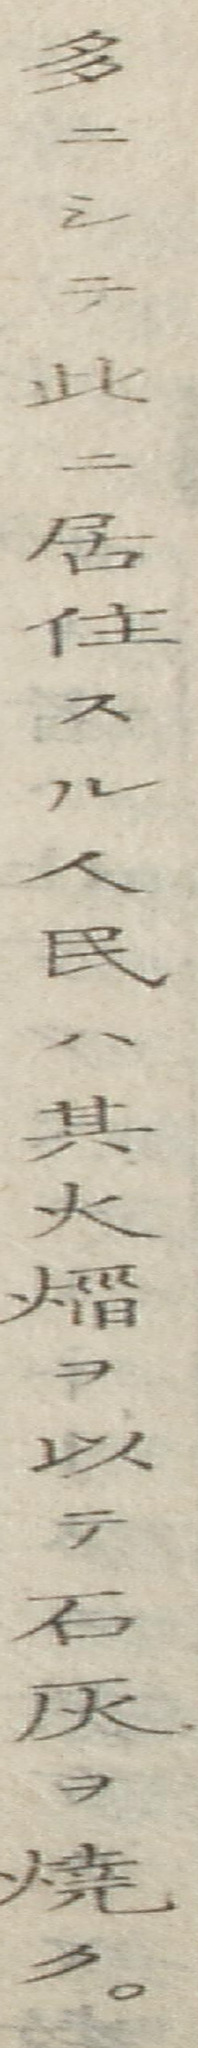多ニシテ此ニ居住スル人民ハ其火焔ヲ以石灰ヲ焼ク。
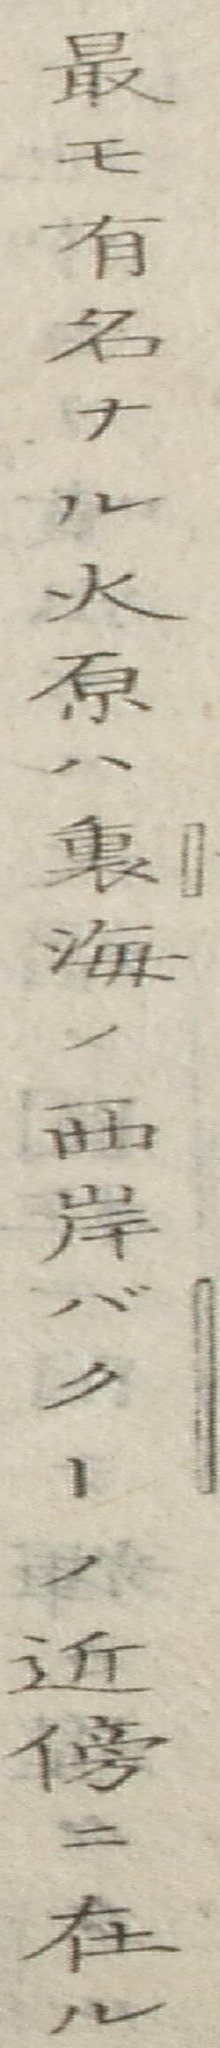最モ有名ナル火原ハ裏海ノ西岸バクーノ近傍ニ在ル
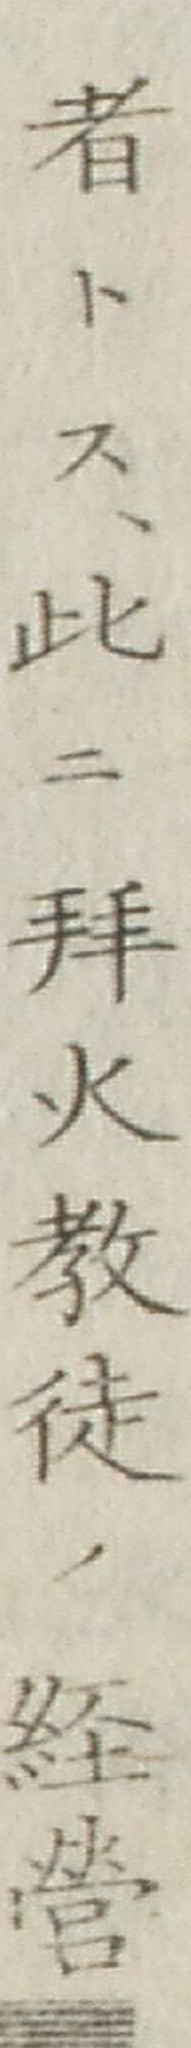者トス、此ニ拝火教徒ノ経営
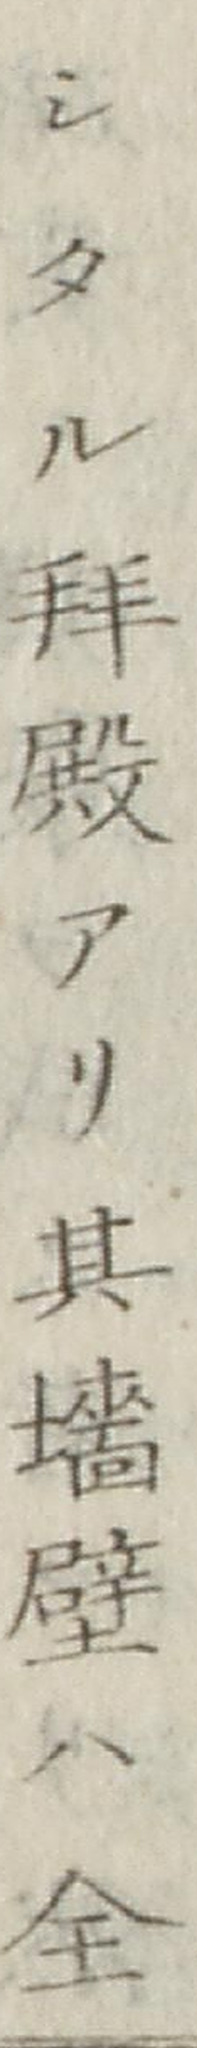シタル拝殿アリ其墻壁ハ全
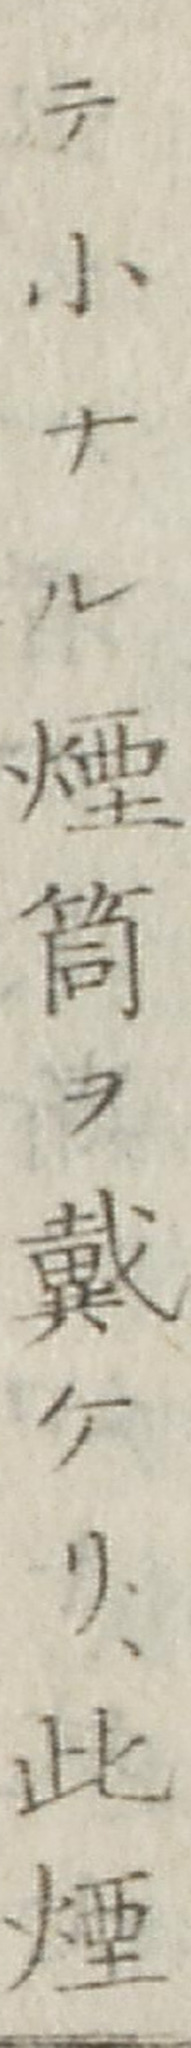テ小ナル煙筒ヲ戴ケリ、此煙
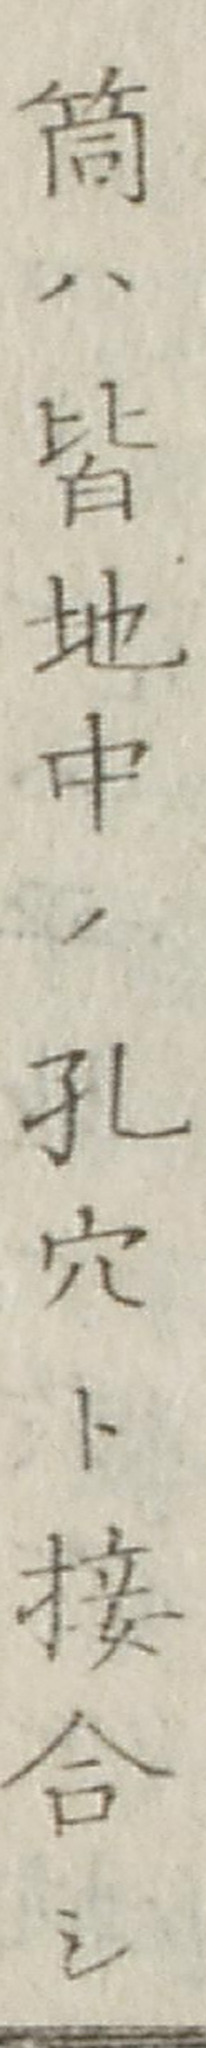筒ハ皆地中ノ孔穴ト接合シ
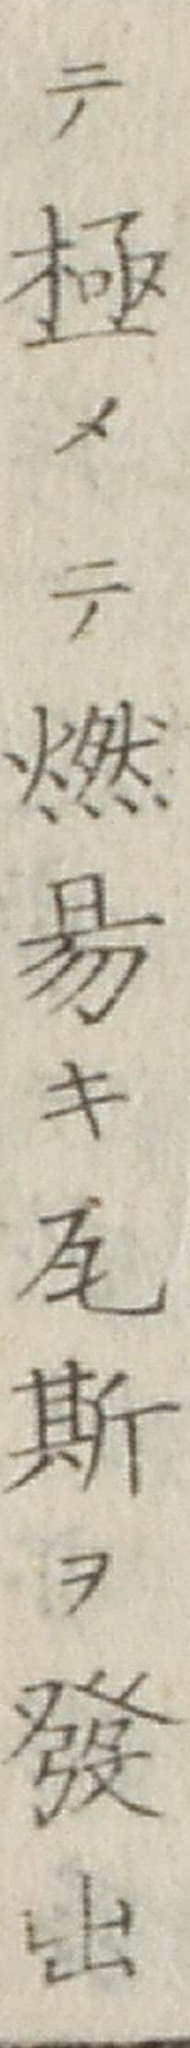テ極メテ燃易キ瓦斯ヲ発出
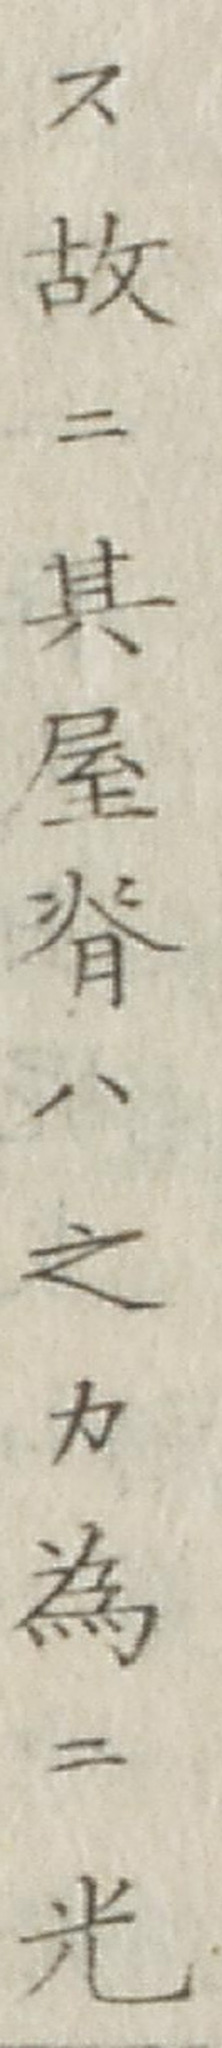ス故ニ其屋背ハ之カ為ニ光
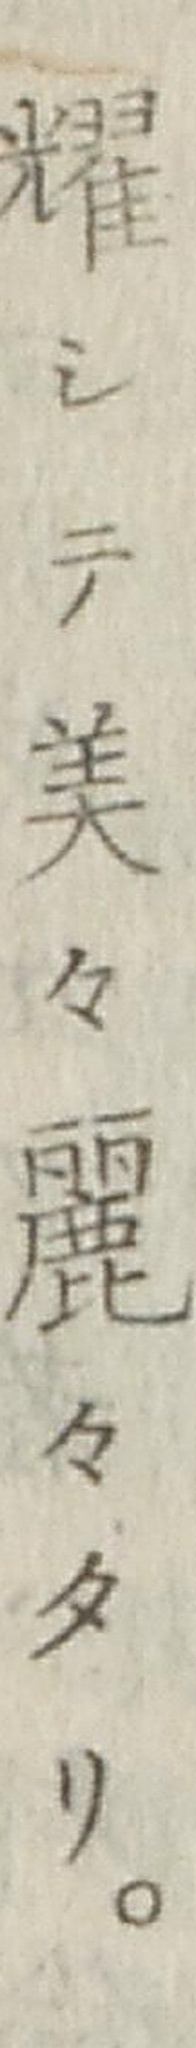耀シテ美々麗々タリ。
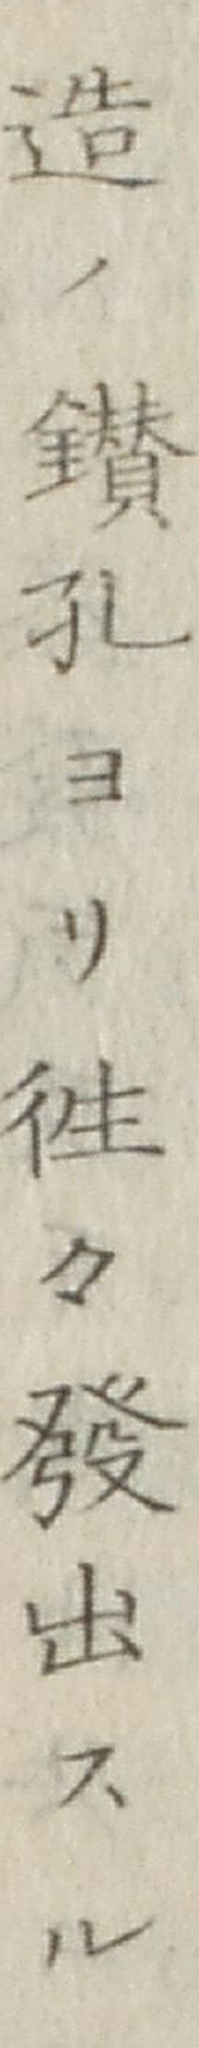造ノ鑚孔ヨリ往々発出スル
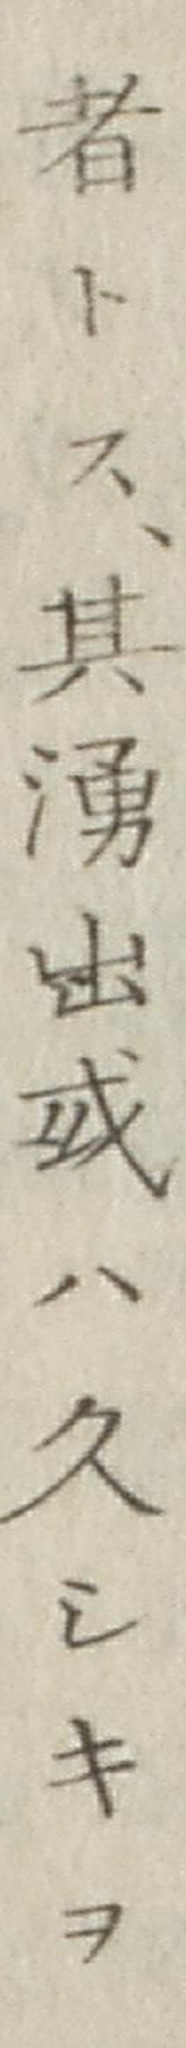者トス、其湧出或ハ久シキヲ
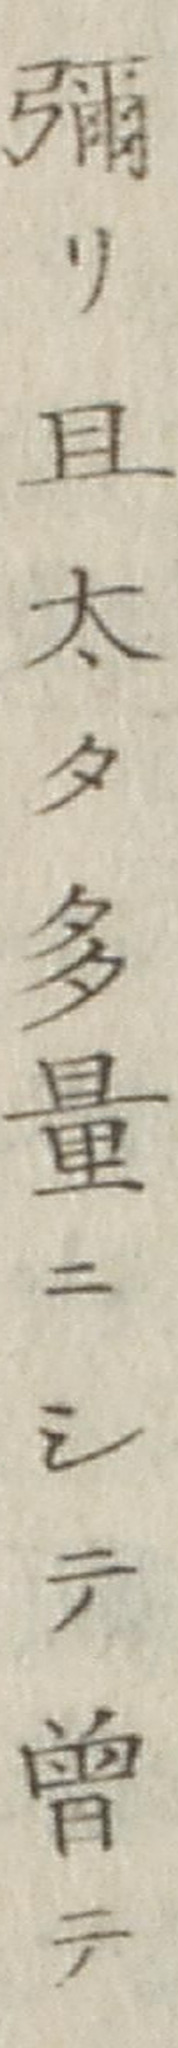彌リ且太タ多量ニシテ曾テ
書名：地形論　巻二
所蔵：東京大学地震研究所図書室 Earthquake Research Institute Library, The University of Tokyo, JAPAN
